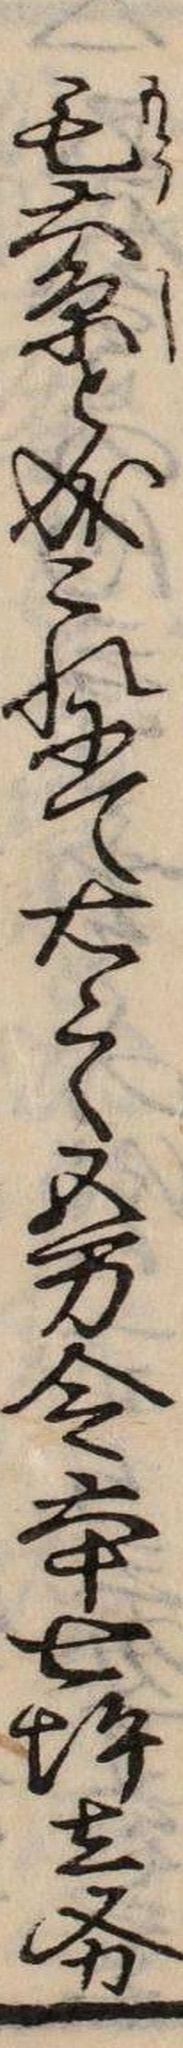毛六糸と成これにて右の五万令六十七坪壱分
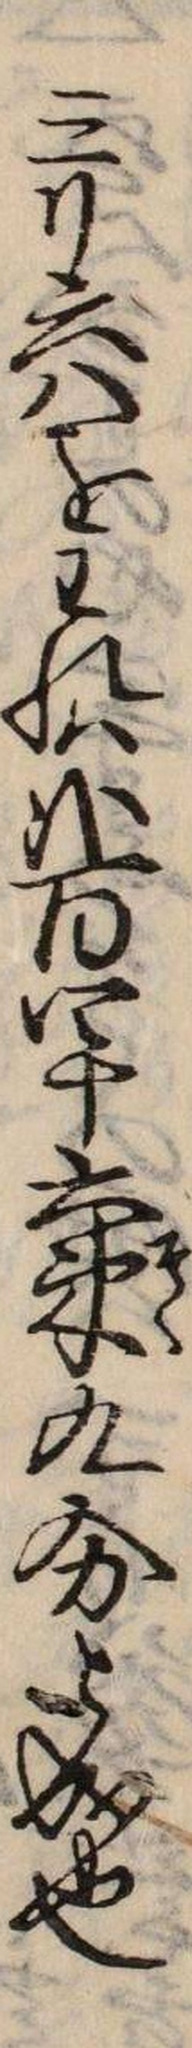三り六八をわれは弐百四十六束九分と成也
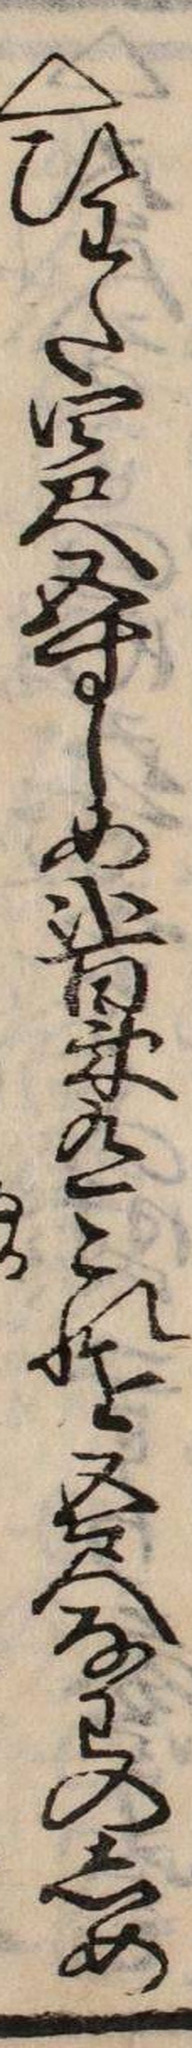△ひわた四尺五寸しめ弐百束有これを五尺なわのしめ
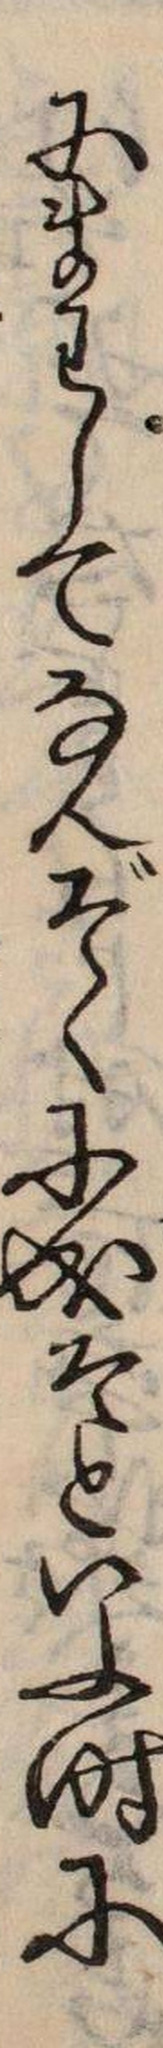にまわしてなんぞくに成そといふ時に
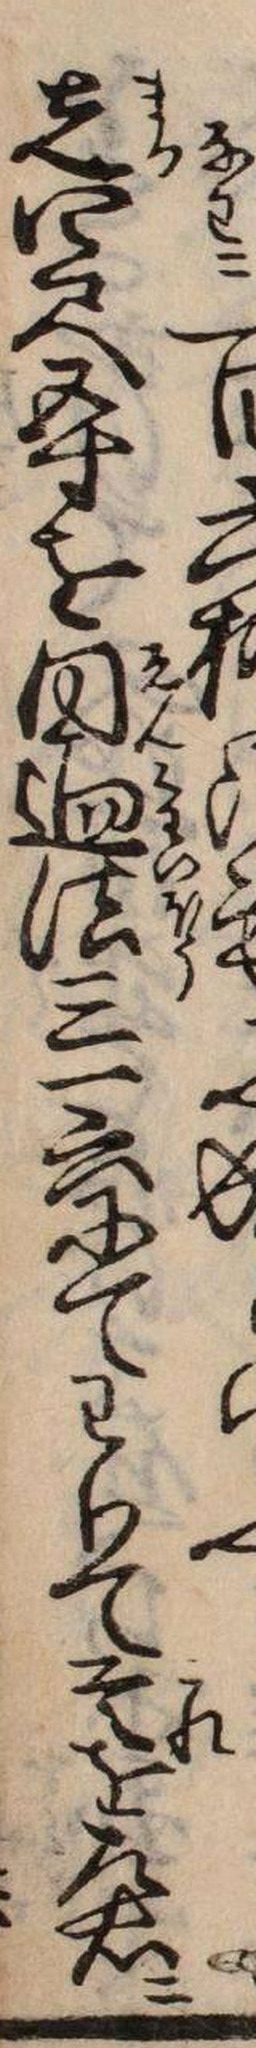先四尺五寸を円廻法三一六にてわりて是を左右に

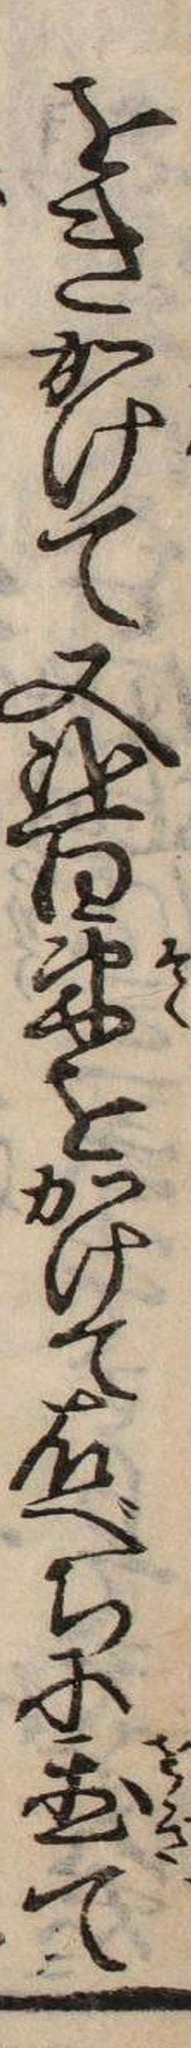をきかけて又弐百束をかけて右べちに置て
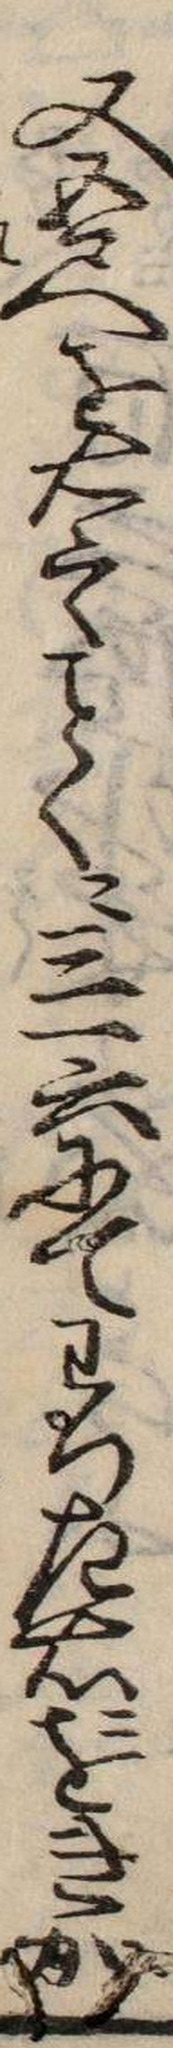又五尺を右のことくに三一六にてわり左右にをきか
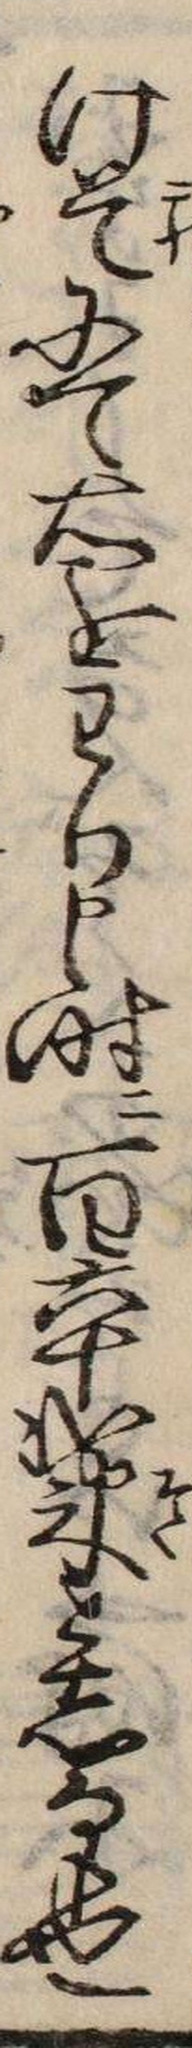け是にて右をわり申候時に百六十弐束としるゝ也
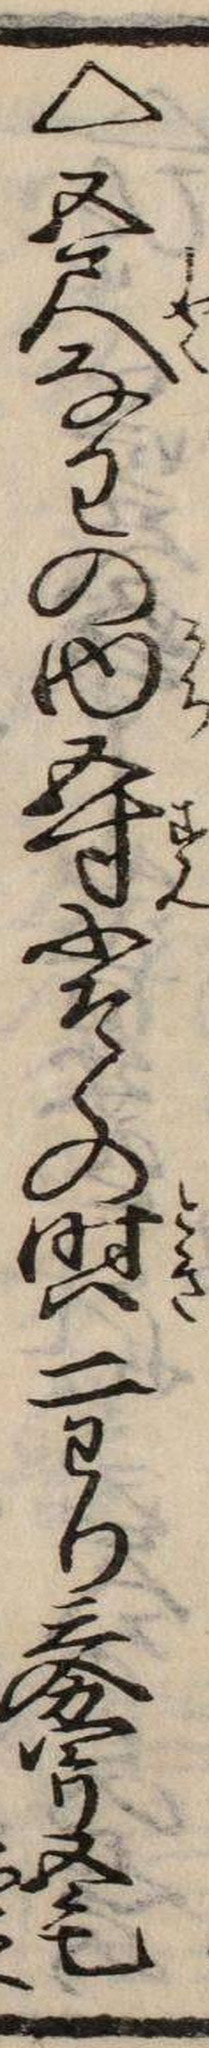△五尺なわの内五寸ふそくの時は二わり三分四り五毛ふそく
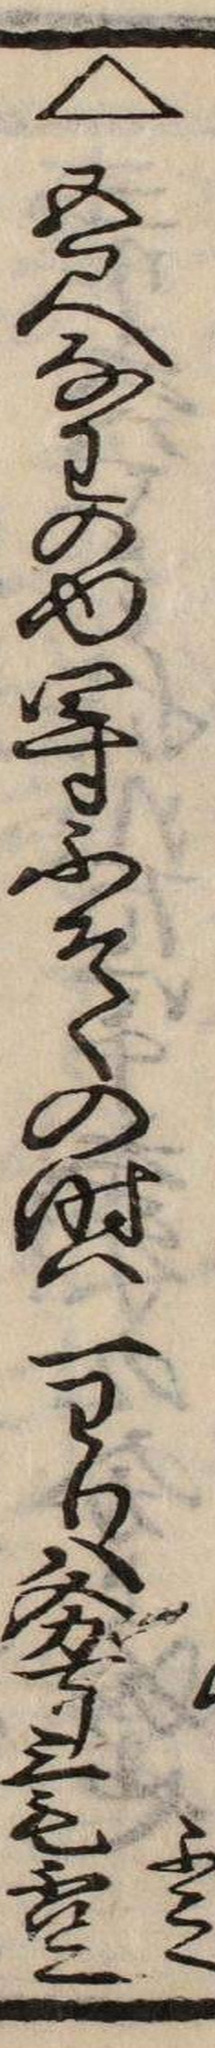△五尺なわの内四寸ふそくの時は一わり八分七り三毛不足
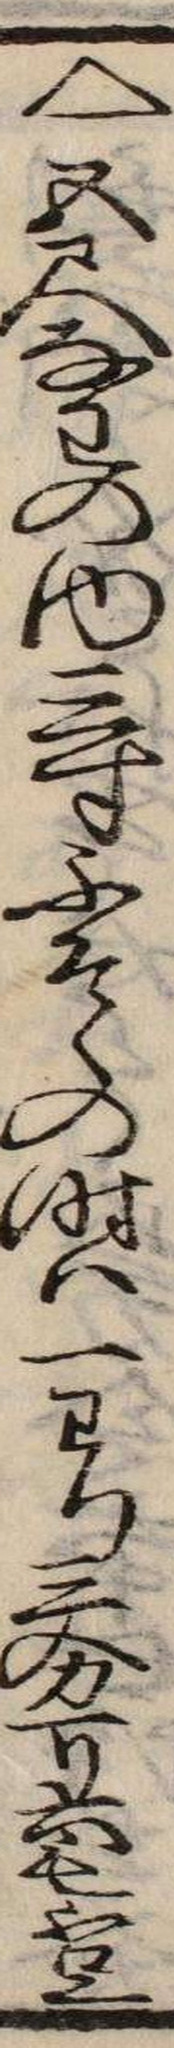△五尺なわの内三寸ふそくの時は一わり三分一り六毛不足
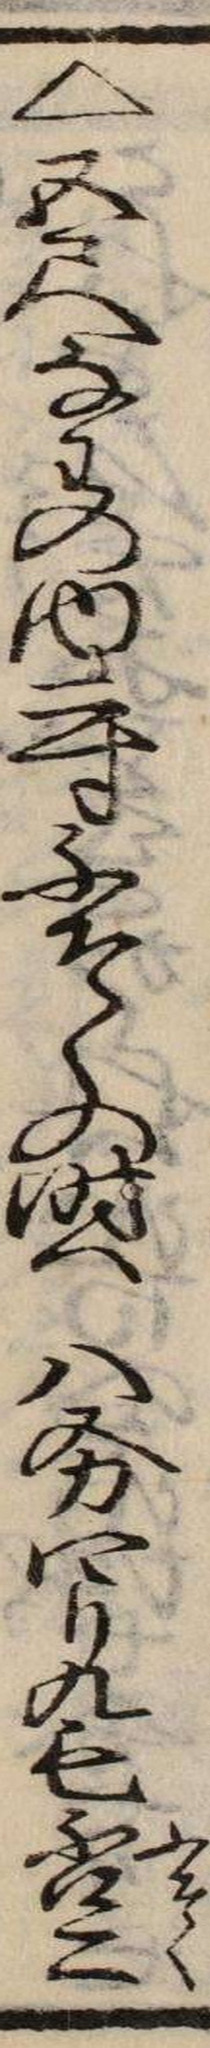△五尺なわの内二寸ふそくの時は八分四り九毛不足
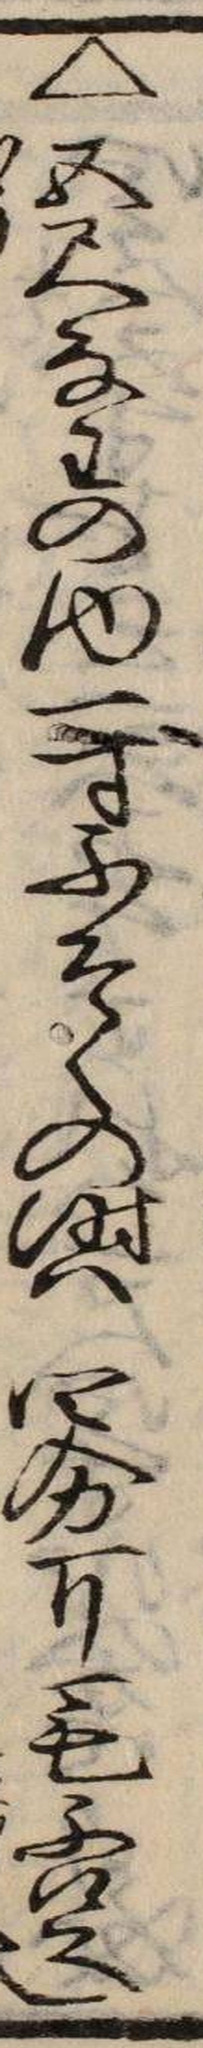△五尺なわの内一寸ふそくの時は四分一り一毛不足也
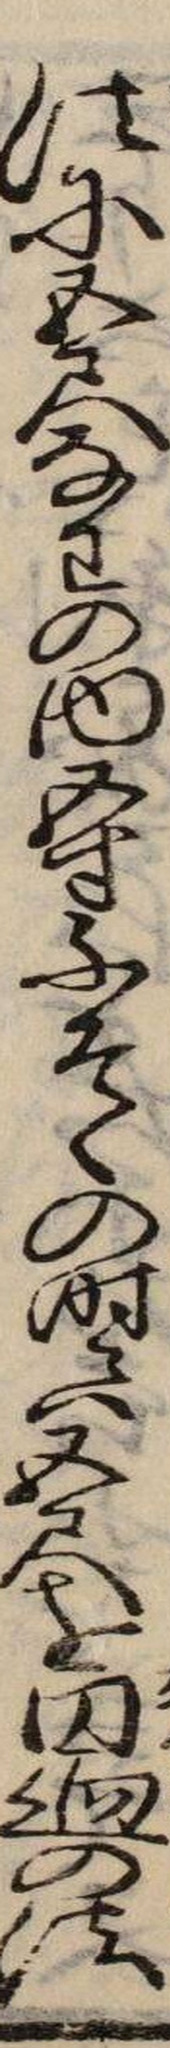法に五尺なわの内五寸ふそくの時には五尺を円廻の法
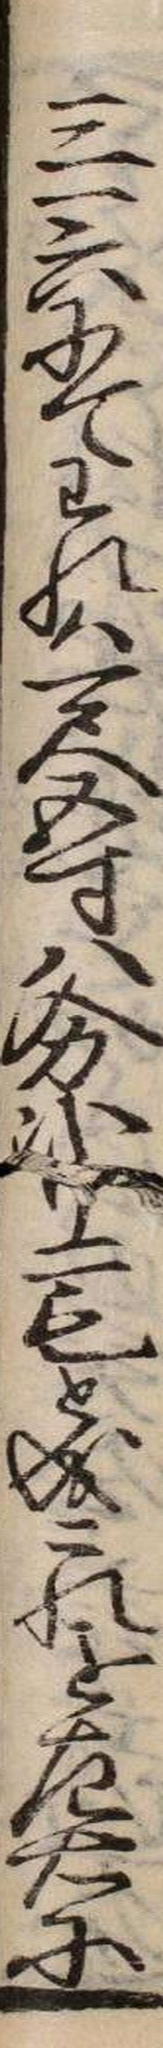三一六にてわれは一尺五寸八分弐り二毛と成これを左右に
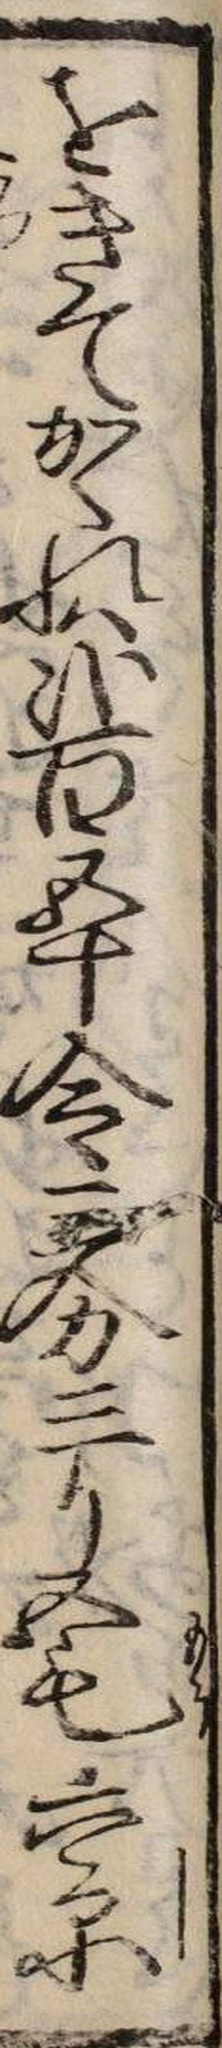をきてかくれは弐百五十令三分三り五毛六糸
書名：塵劫記（寛永11年自跋、京都府立京都学・歴彩館追貴8）
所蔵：京都府立京都学・歴彩館 国文学研究資料館
